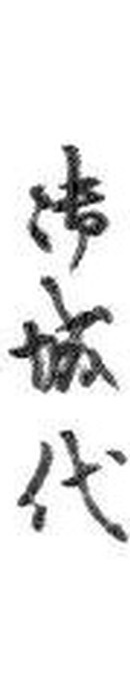御城代
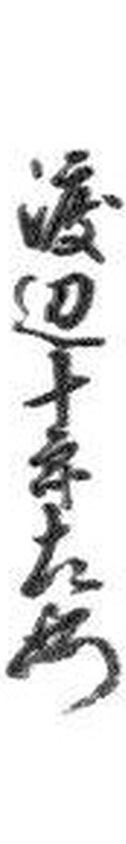渡辺十郎左衛門

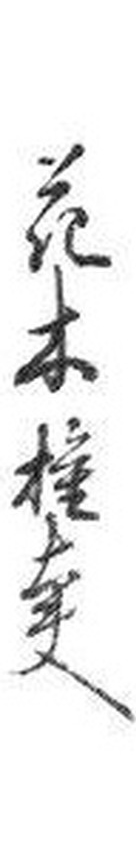花木権大夫
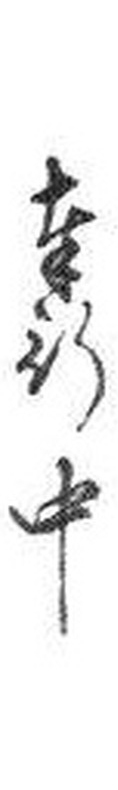奉行中
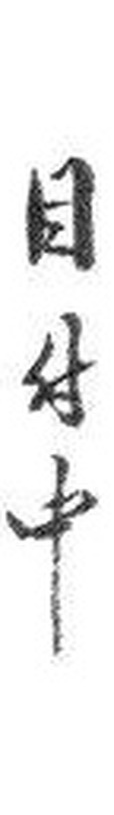目付中
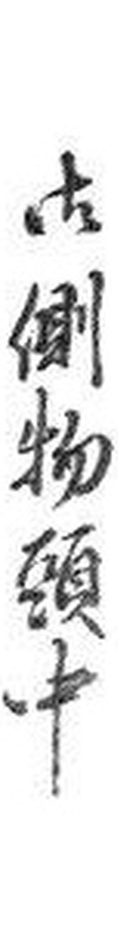御側物頭中
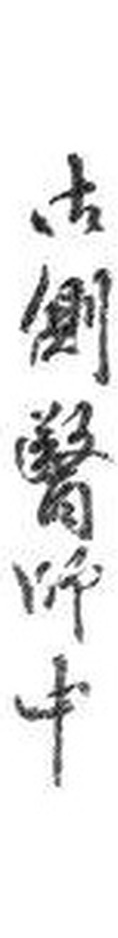御側医師中
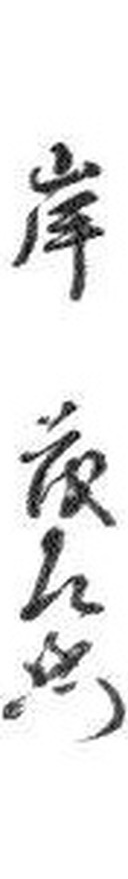岸茂左衛門
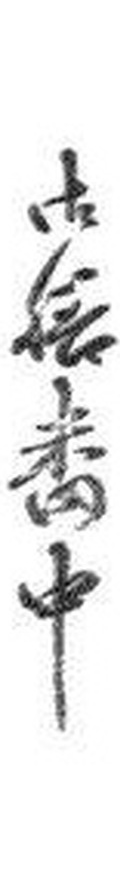御膳番中
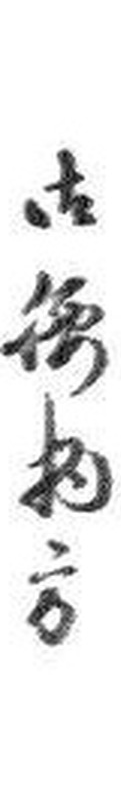御腰物方
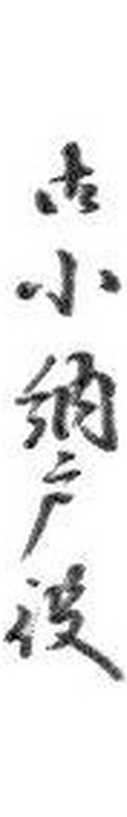御小納戸役
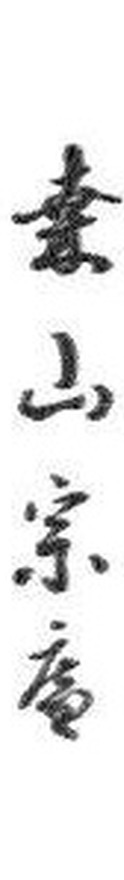桑山宗庵
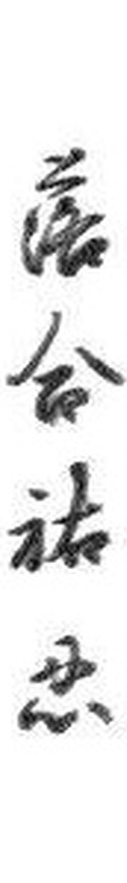落合祐忍
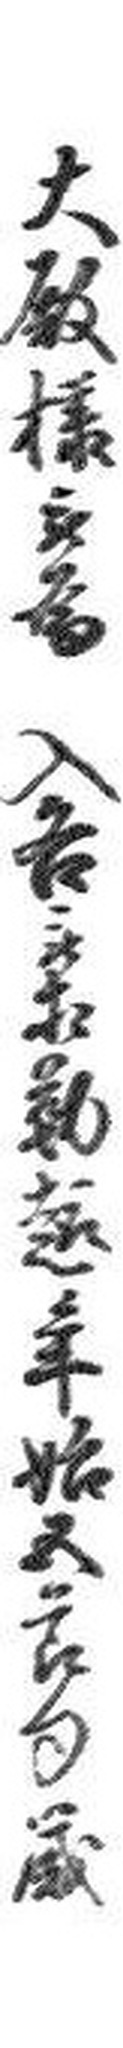大殿様被為入各被相勤趣年始五節句歳
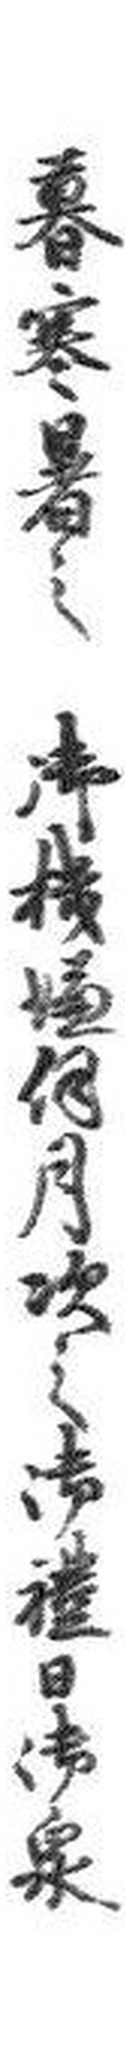暮寒暑之御機嫌伺月次之御礼日御泉
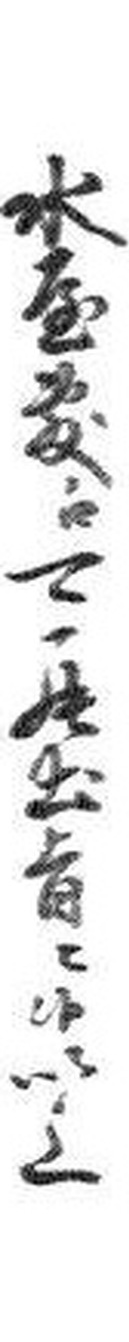水屋敷江可罷出旨ニ候以上
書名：家譜 二十六 吉品公 従宝永七年到正徳二年
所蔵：福井県文書館 Fukui Prefectural Archives
